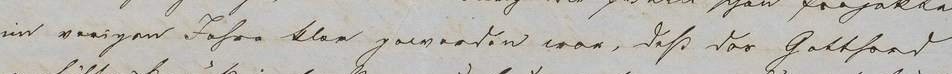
im vorigen Jahre klar geworden war, daß der Gotthard
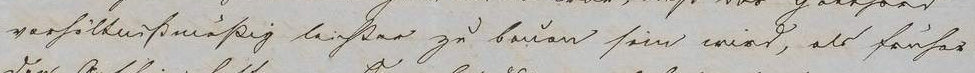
verhältnißmäßig leichter zu bauen sein wird, als früher
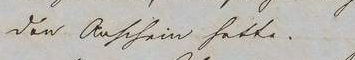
den Anschein hatte.
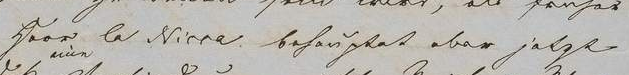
Herr La Nicca behauptet aber jetzt
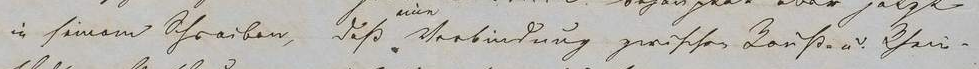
in seinem Schreiben, daß eine Verbindung zwischen Reuß- u. Rhein -
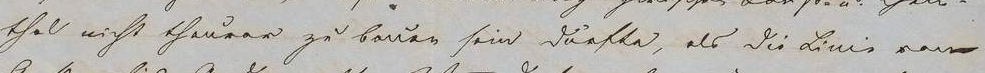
thal nicht theurer zu bauen sein dürfte, als die Linie von
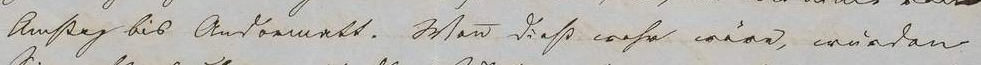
Amsteg bis Andermatt. Wenn dieß wahr wäre, würden
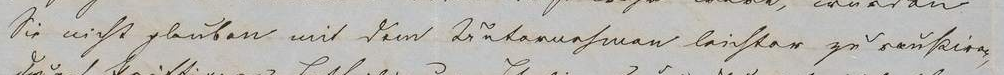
Sie nicht glauben mit dem Unternehmen leichter zu reussiren,
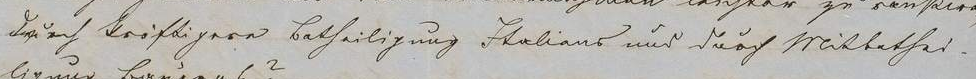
durch kräftigere Betheiligung Italiens und durch Mitbethei-
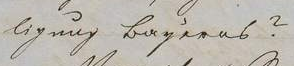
ligung Bayerns?
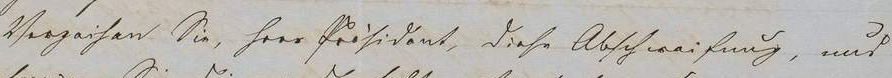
Verzeihen Sie, Herr Präsident, diese Abschweifung, und
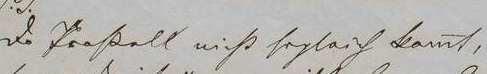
Da Preßell nicht sogleich kommt,
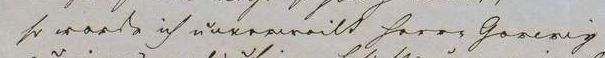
so werde ich unverweilt Herrn Gerwig
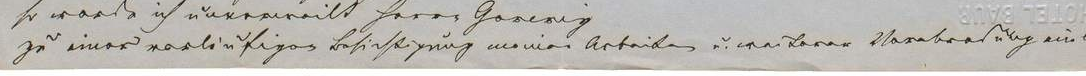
zu einer vorläufigen Besichtigung meiner Arbeiten u. weiterer Verabredung einladen.
